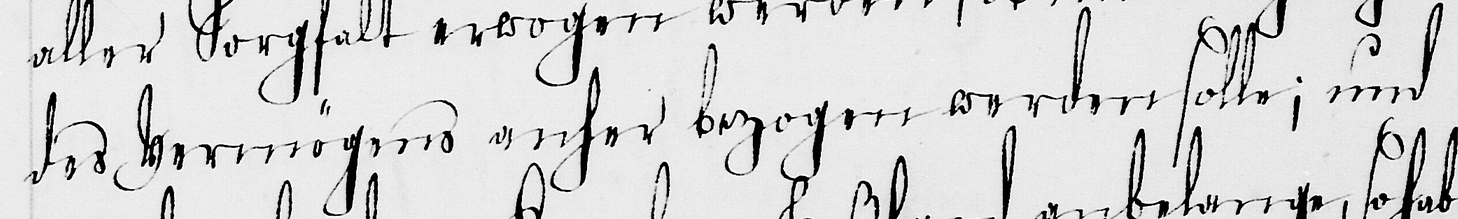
des Vermögens anher bezogen werden solle; und
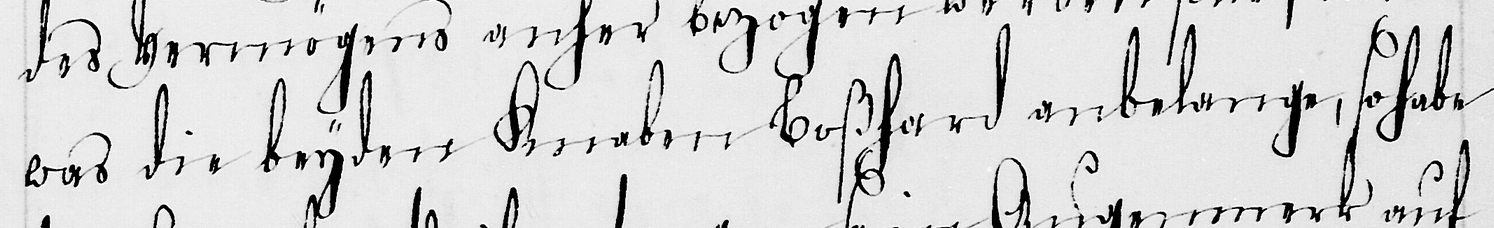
was die beyden Knaben Boßhard anbelange, so ha¬
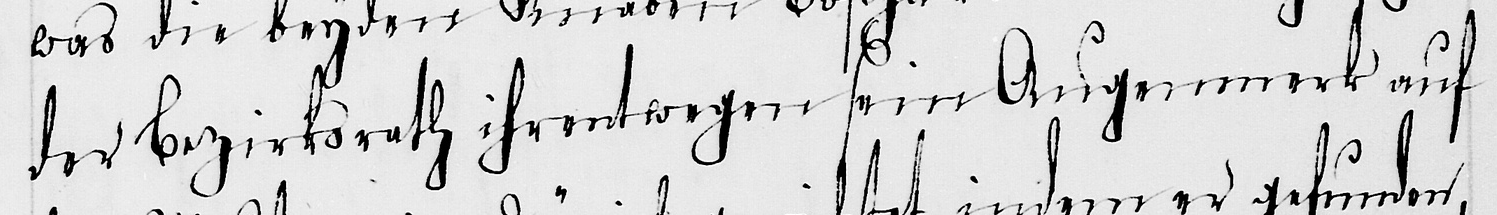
der Bezirksrath ihrentwegen sein Augenmerk auf
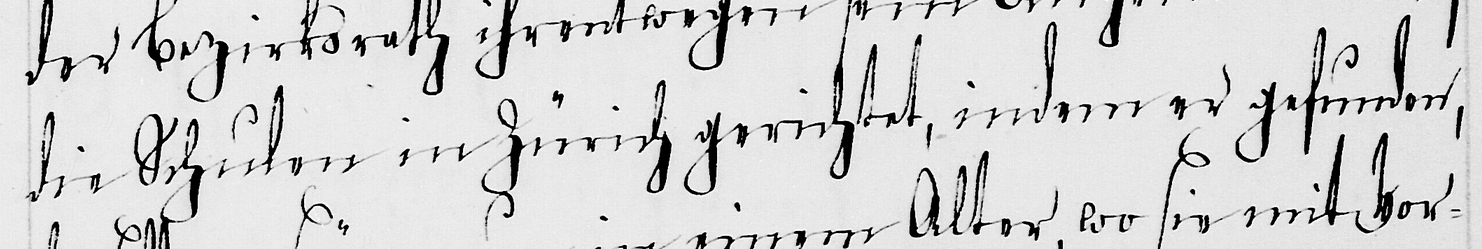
die Schulen in Zürich gerichtet, indem er gefunden,
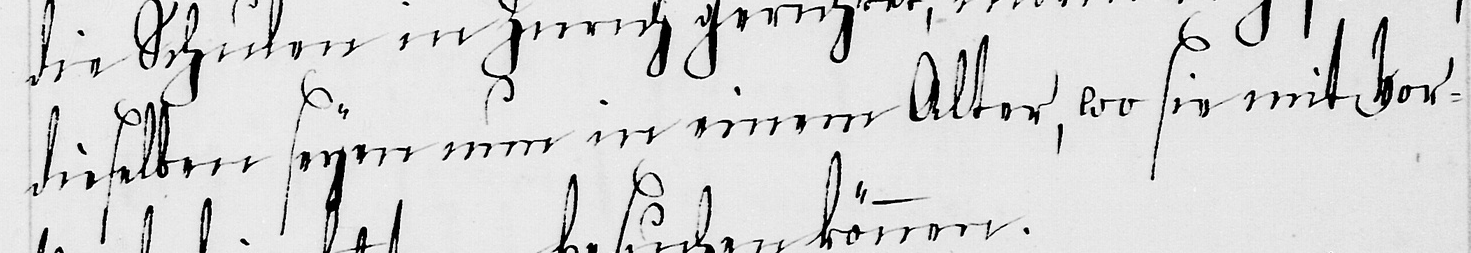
dieselben seyen nun in einem Alter, wo sie mit Vor¬
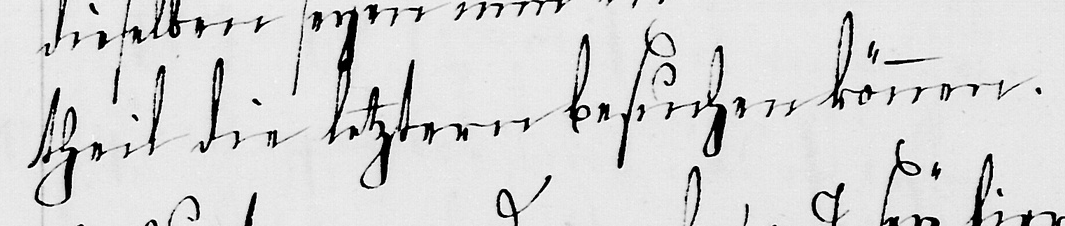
theil die letztern besuchen können.
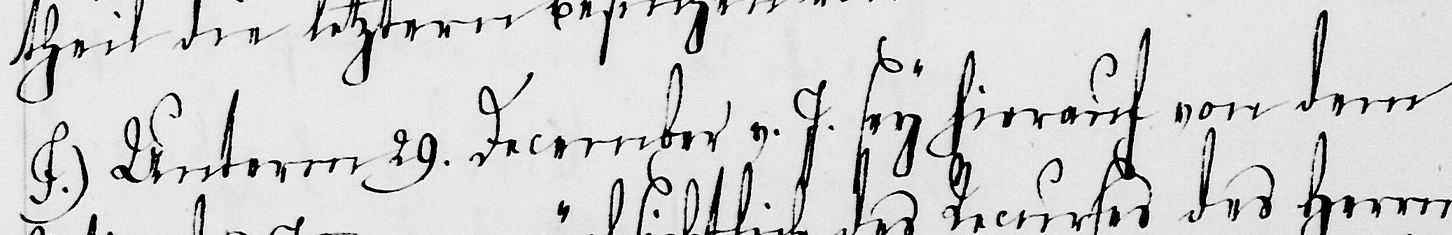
F.) Unterm 29. December v. J. sey hierauf von dem
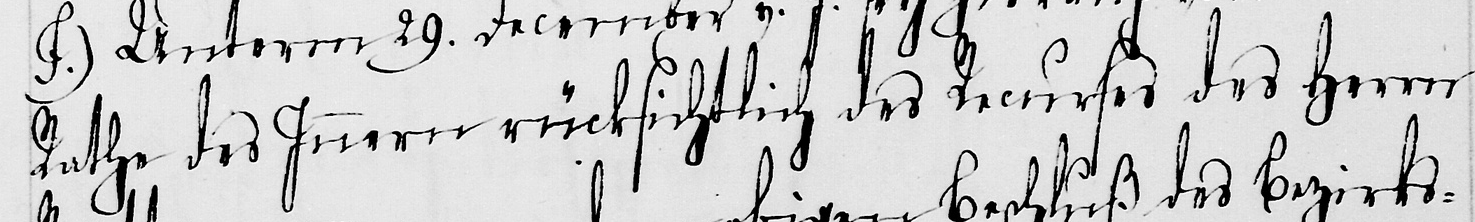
Rathe des Innern rücksichtlich des Recurses des Herrn
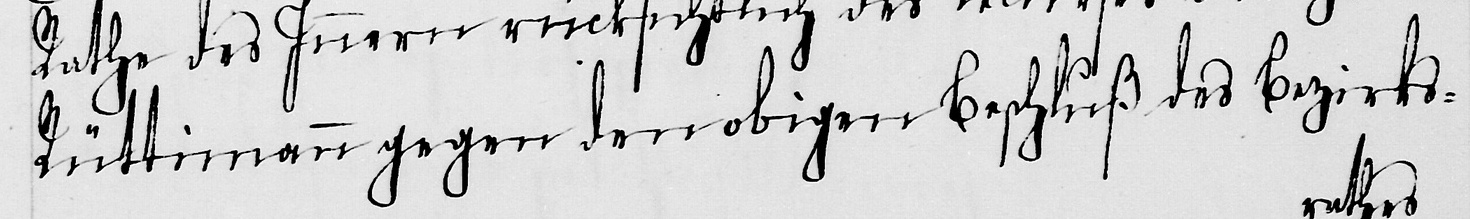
Rüttimann gegen den obigen Beschluß des Bezirks-
